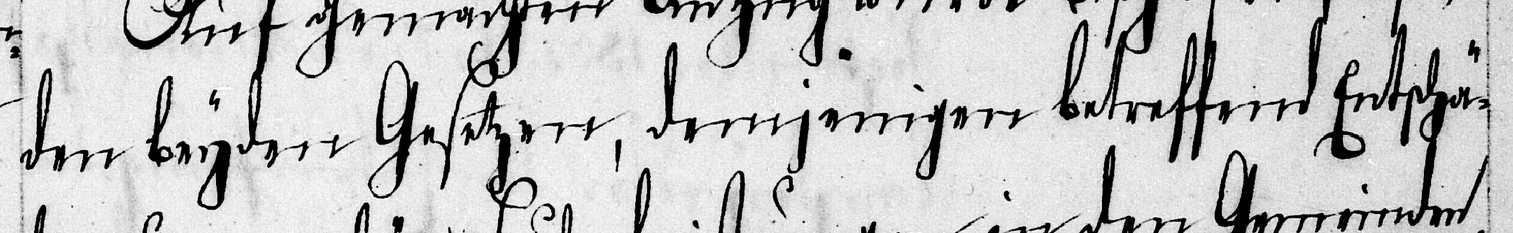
den beyden Gesetzen, demjenigen betreffend Entschä¬
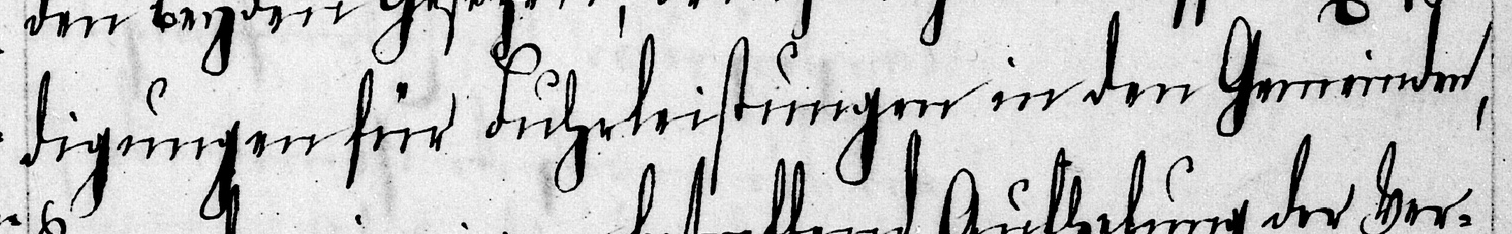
digungen für Fuhrleistungen in den Gemeinden,
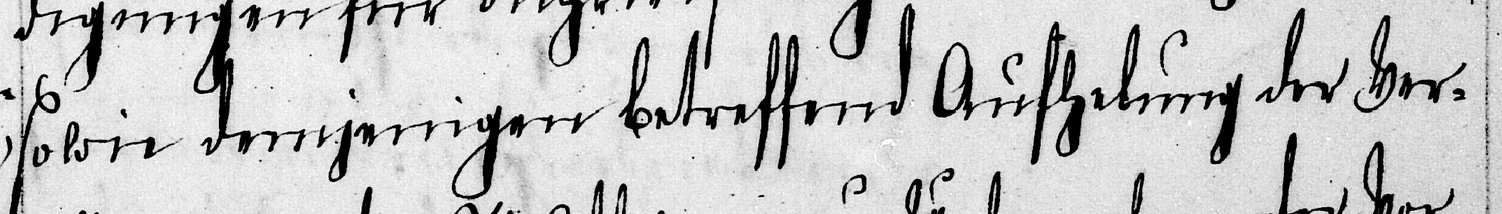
sowie demjenigen betreffend Aufhebung der Ver¬
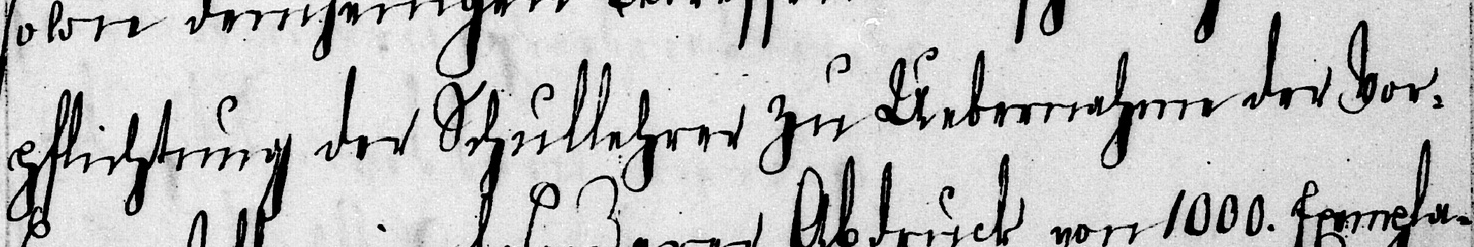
pflichtung der Schullehrer zu Uebernahme der Vor¬
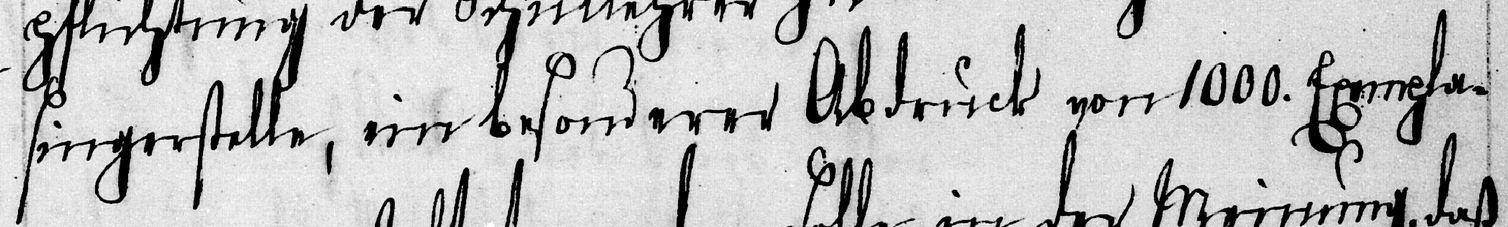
singerstelle, ein besonderer Abdruck von 1000. Exempla¬
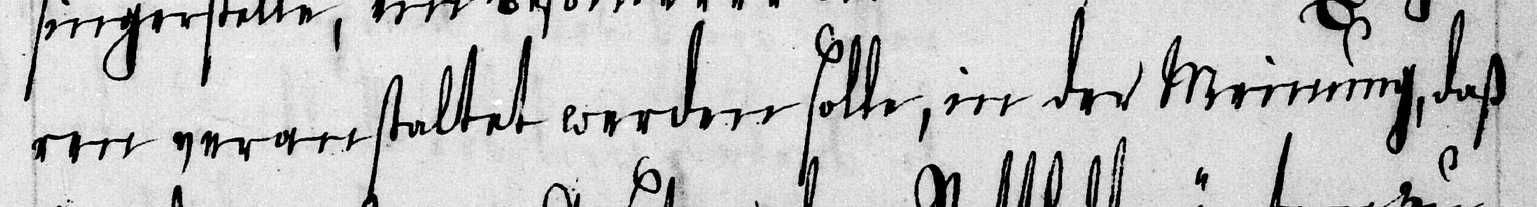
ren veranstaltet werden solle, in der Meinung, daß
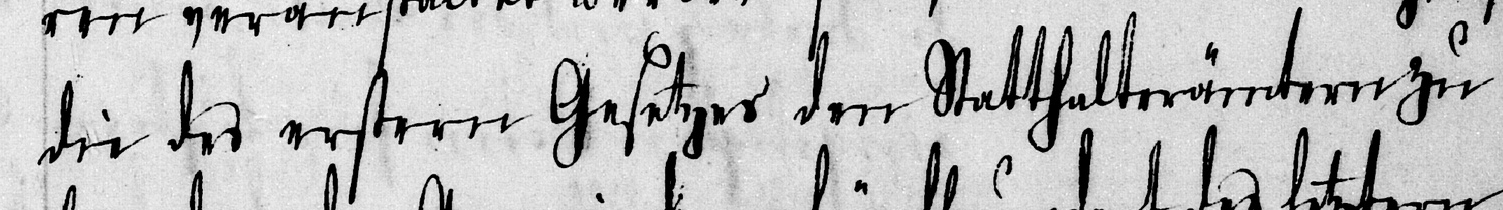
die des erstern Gesetzes den Statthalterämtern zu
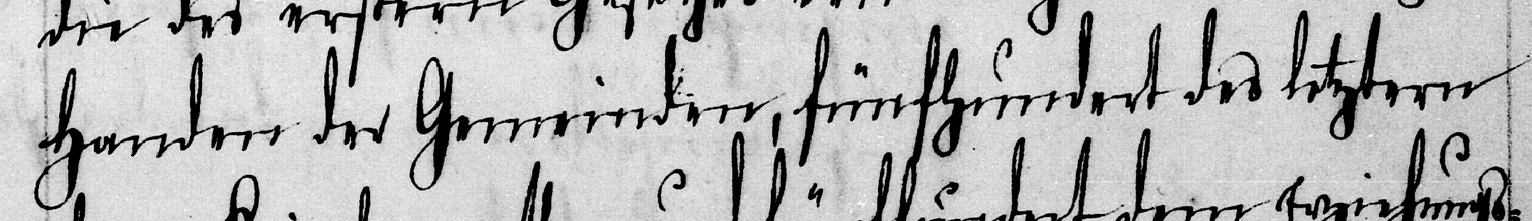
Handen der Gemeinden, fünfhundert des letztern
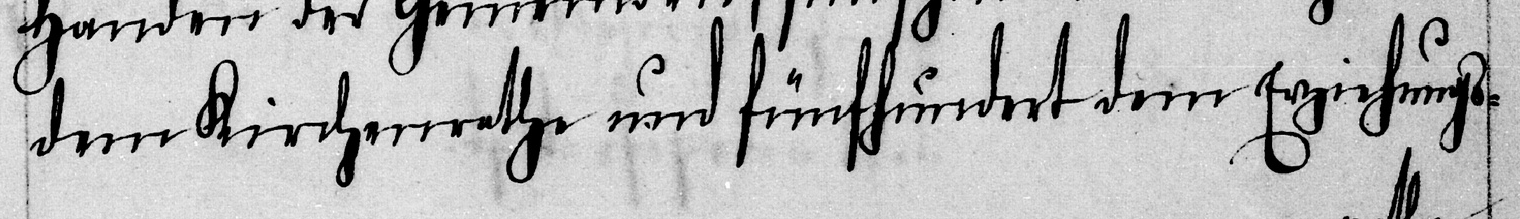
dem Kirchenrathe und fünfhundert dem Erziehungs-
